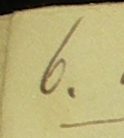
6
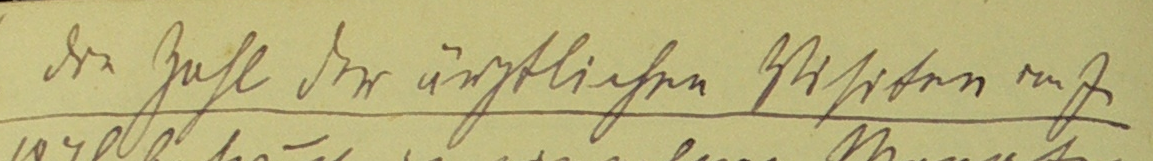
Die Zahl der ärztlichen Visiten in J. 1876
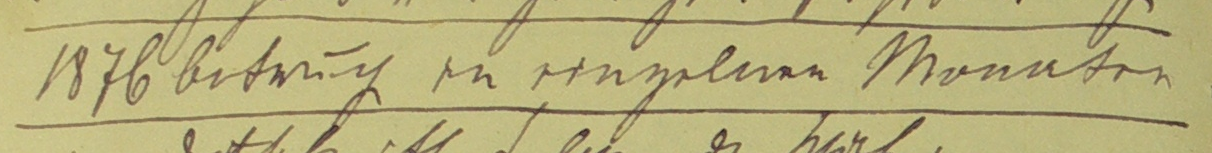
betrug in einzelnen Monaten
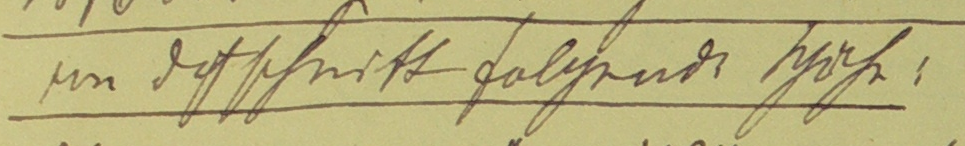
im Durchschnitt folgende Höhe:
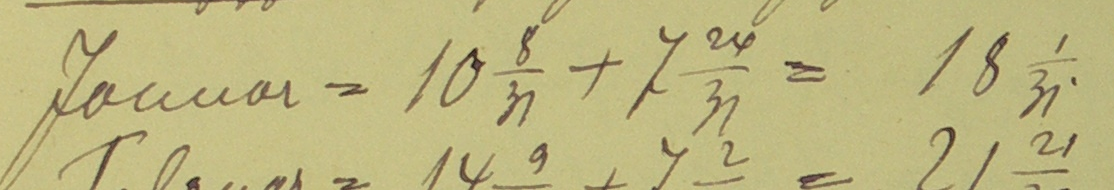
Januar = 10 8/31 + 7 24/31 = 18 1/31
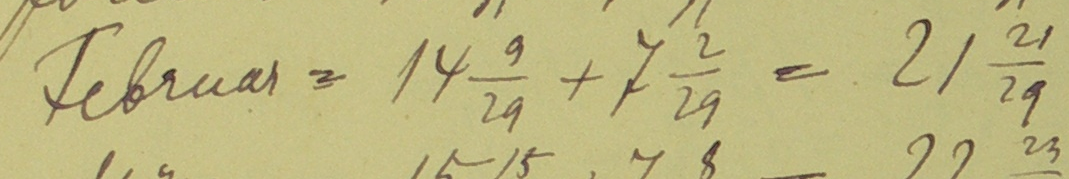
Februar = 14 9/29 + 7 2/29 = 21 21/29
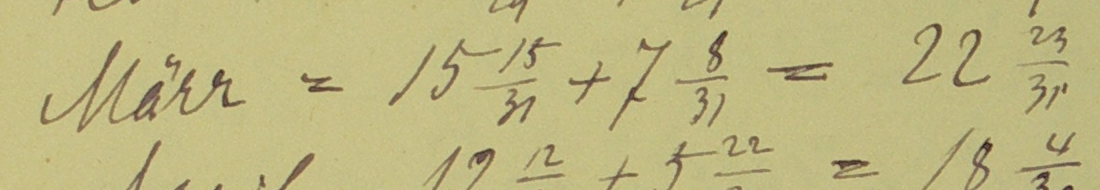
März = 15 15/31 + 7 8/31 = 22 23/31
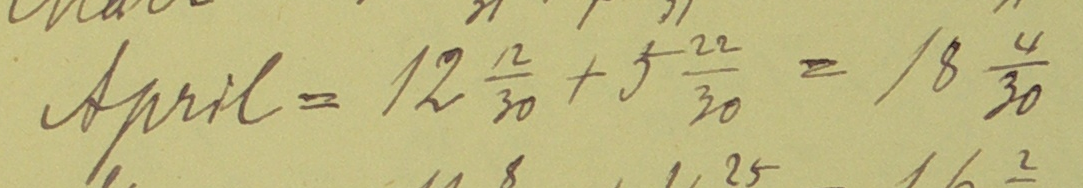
April = 12 12/30 + 5 22/30 = 18 4/30
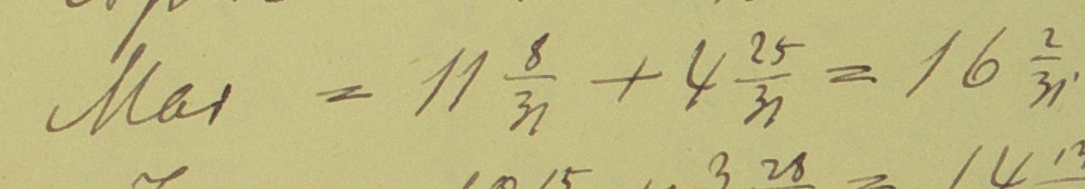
Mai = 11 8/31 + 4 25/31 = 16 2/31
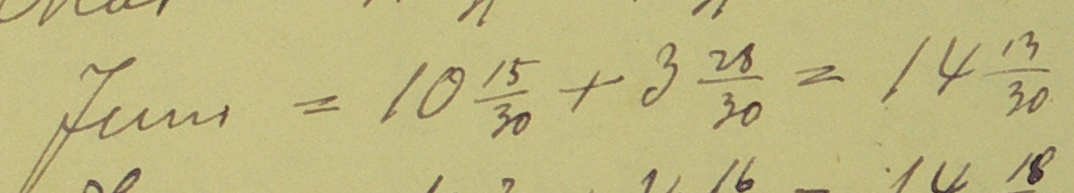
Juni = 10 15/30 + 3 28/30 = 14 13/30
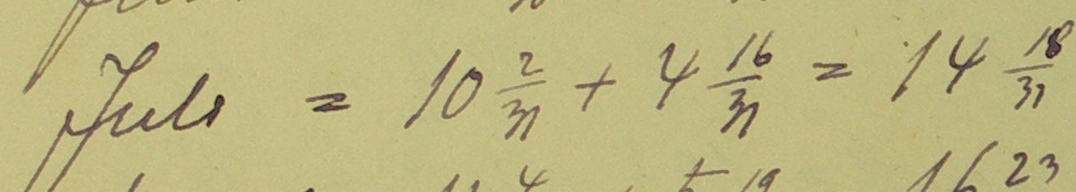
Juli = 10 2/31 + 4 16/31 = 14 18/31
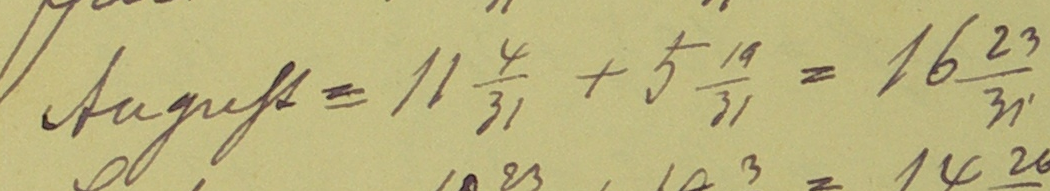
August = 14 4/31 + 5 19/31 = 16 23/31
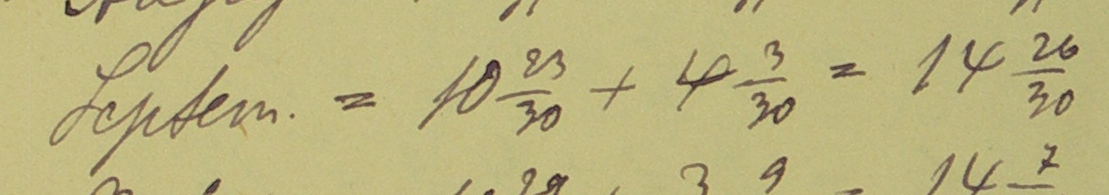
Septem. = 10 23/30 + 4 3/30 = 14 26/30
